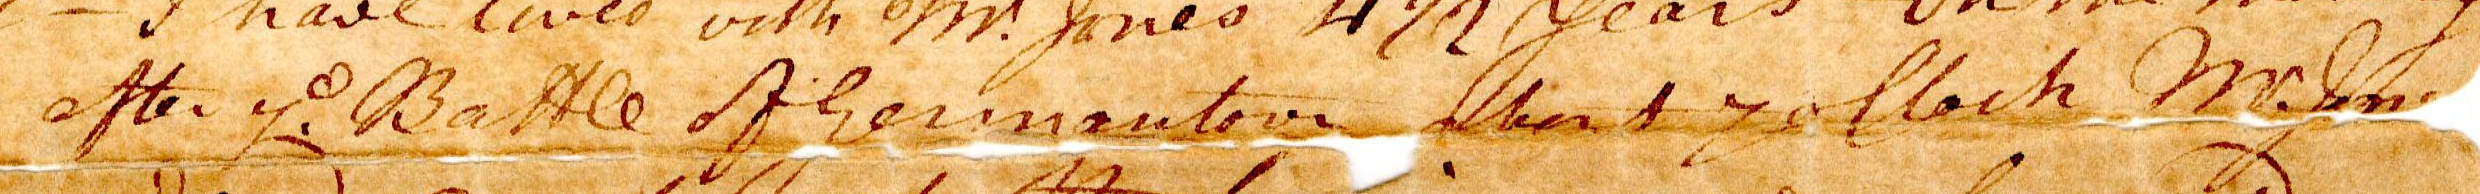after y^e Battle of Germantown about 7 oClock M^r. Jones
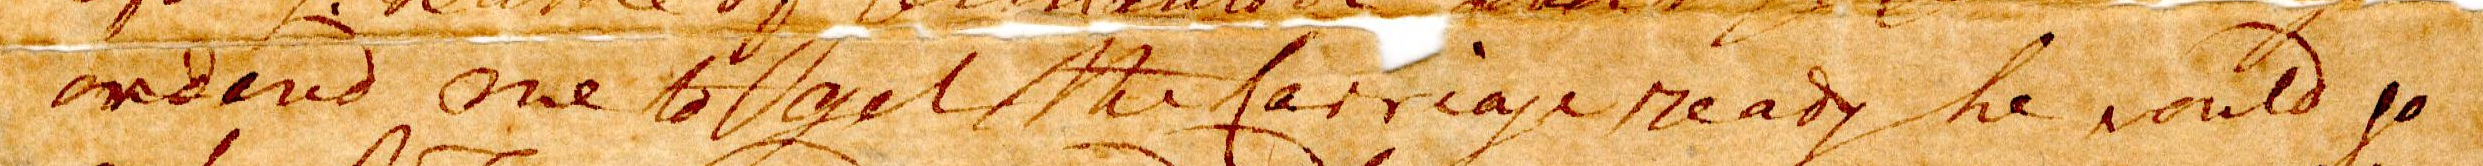ordered me to get the Carriage ready he would go
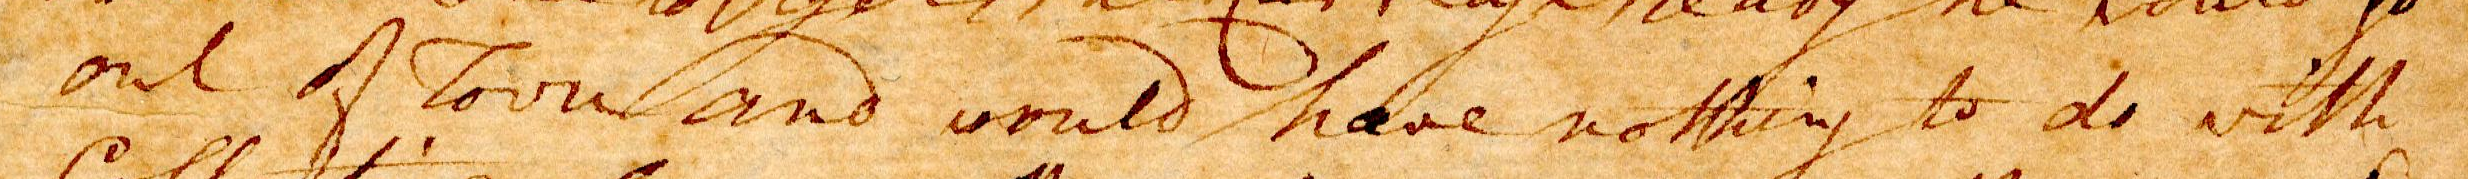out of Town and would have nothing to do with
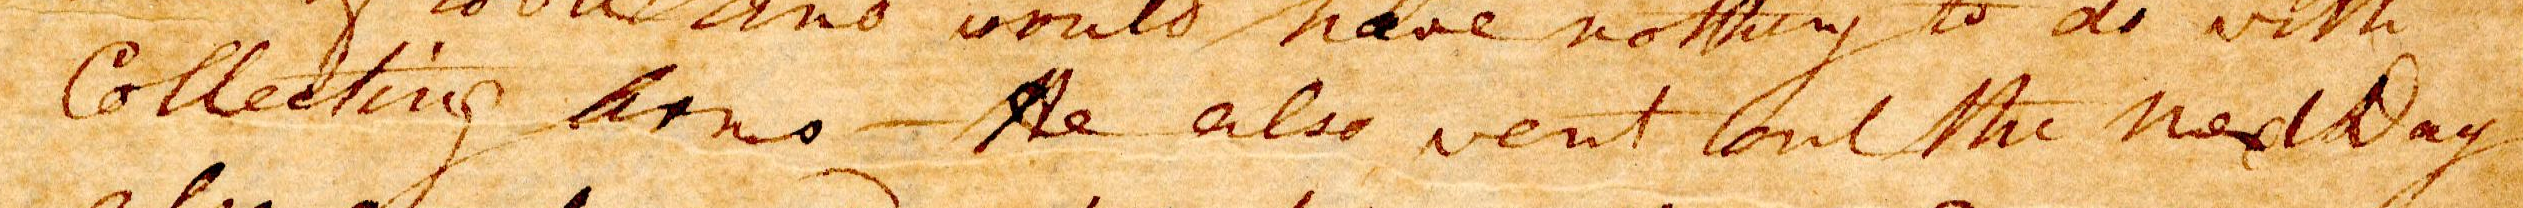collecting arms- He also went out the next Day
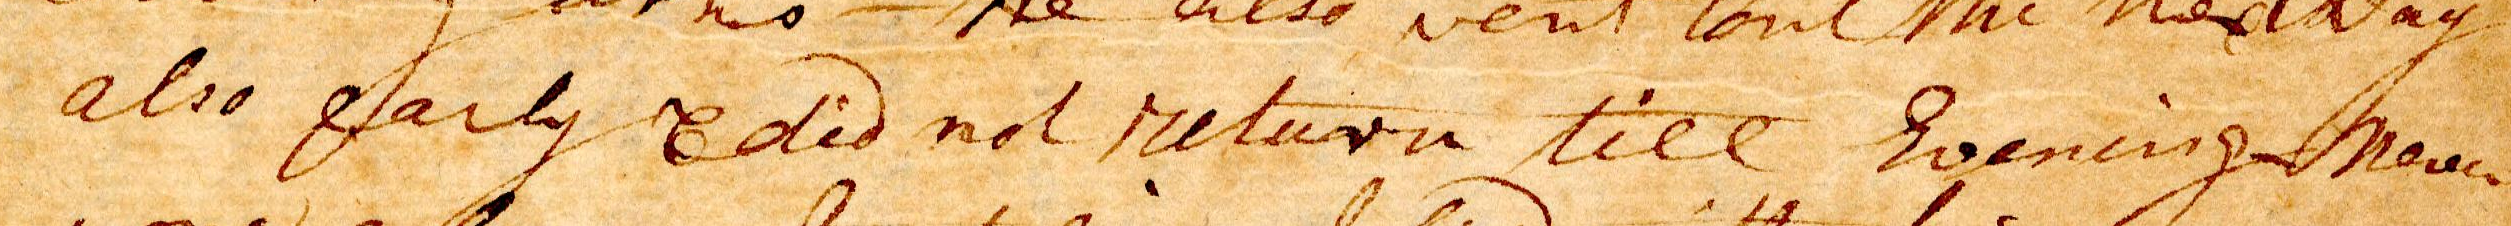also early & did not return till Evening- Never
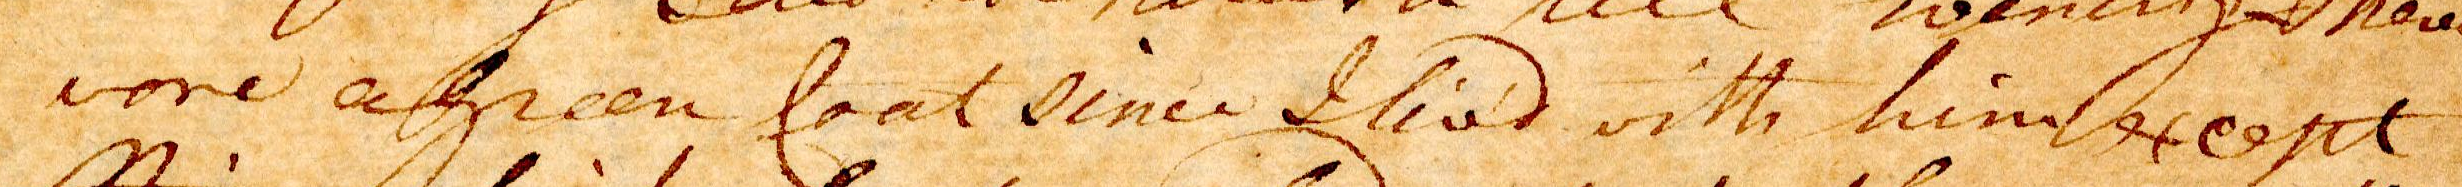wore a green Coat since I liv'd with him except
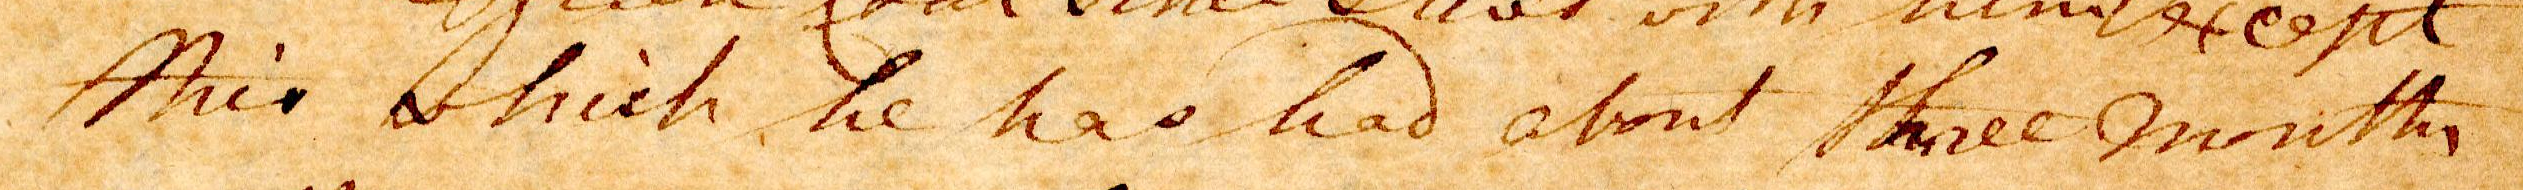This which he has had about three months
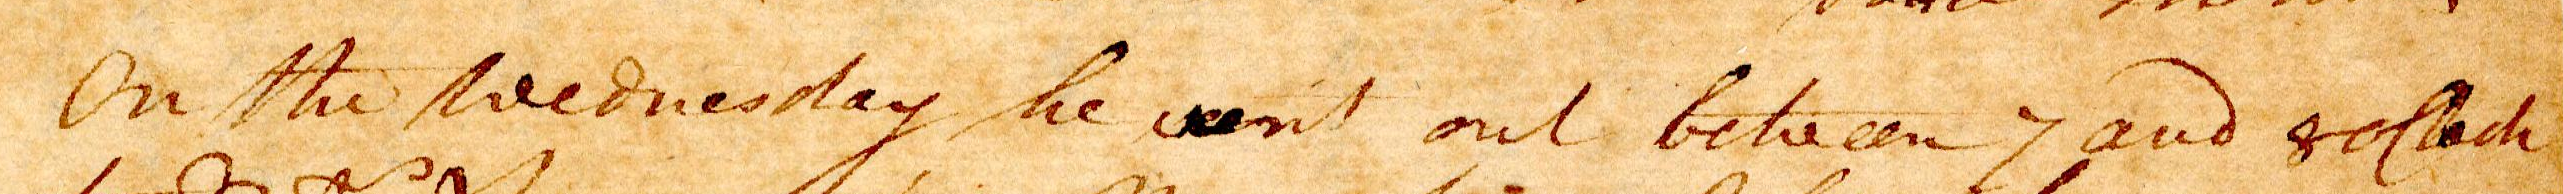On the Wednesday he went out between 7 and 8 oClock
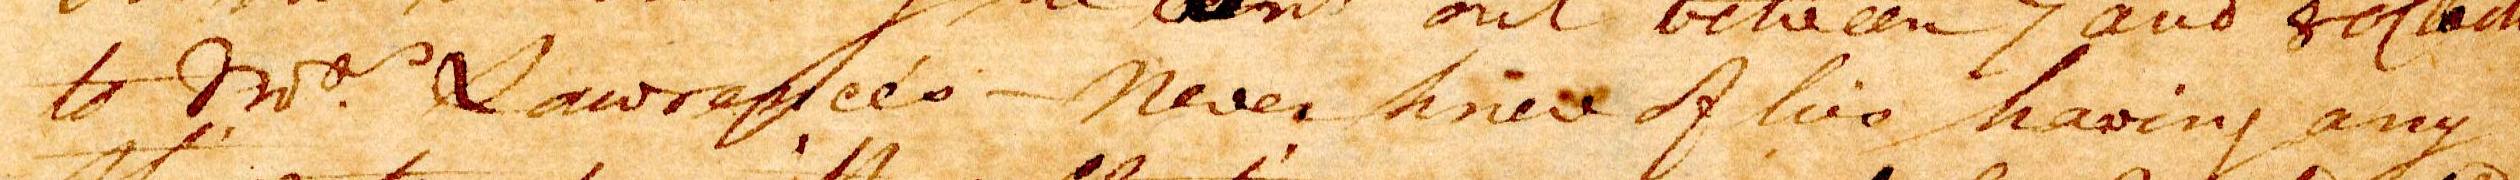to M^rs. Lawrence's- Never knew of his having any
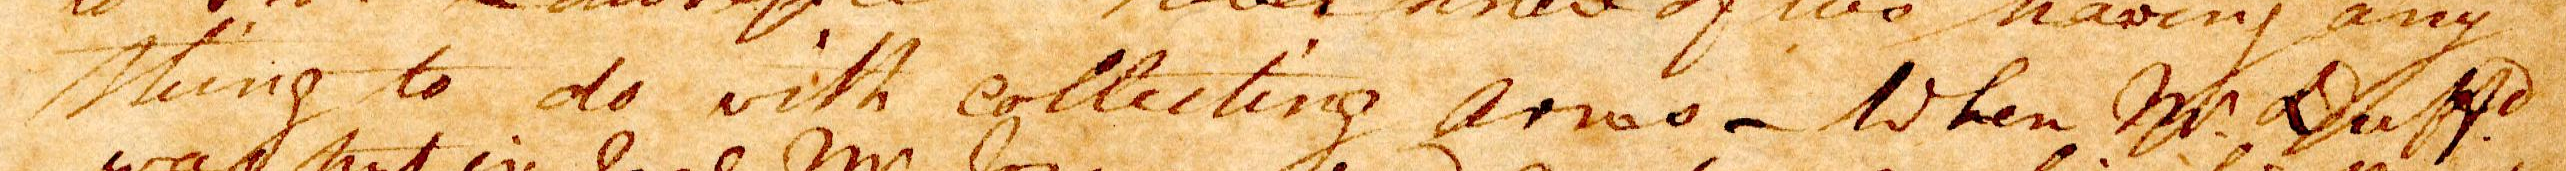thing to do with collecting arms- When M^r Duff^d
